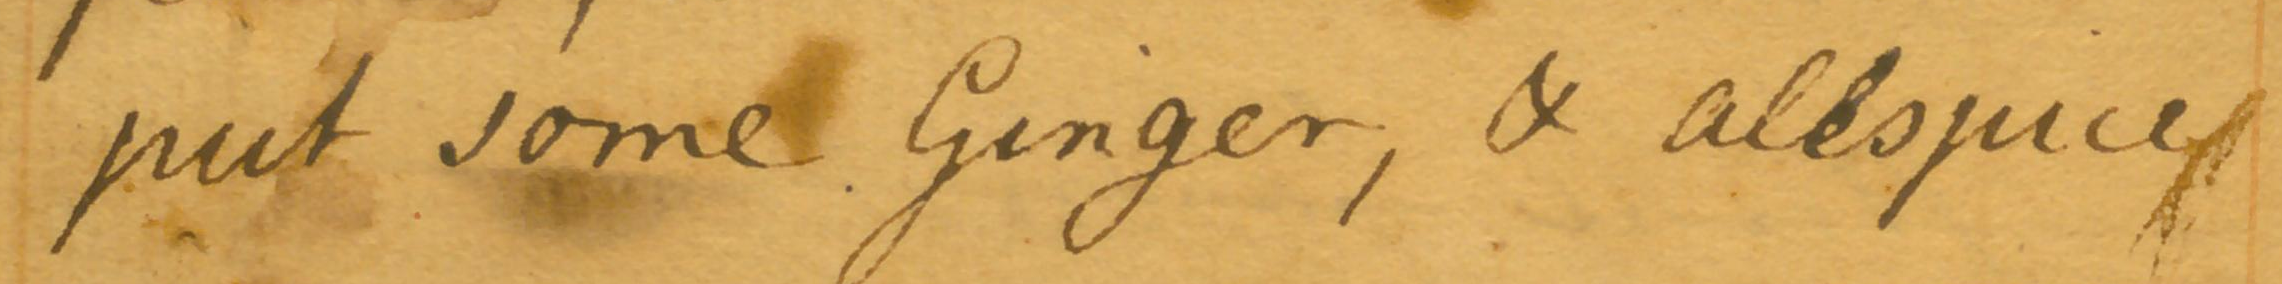put some Ginger, & allspice
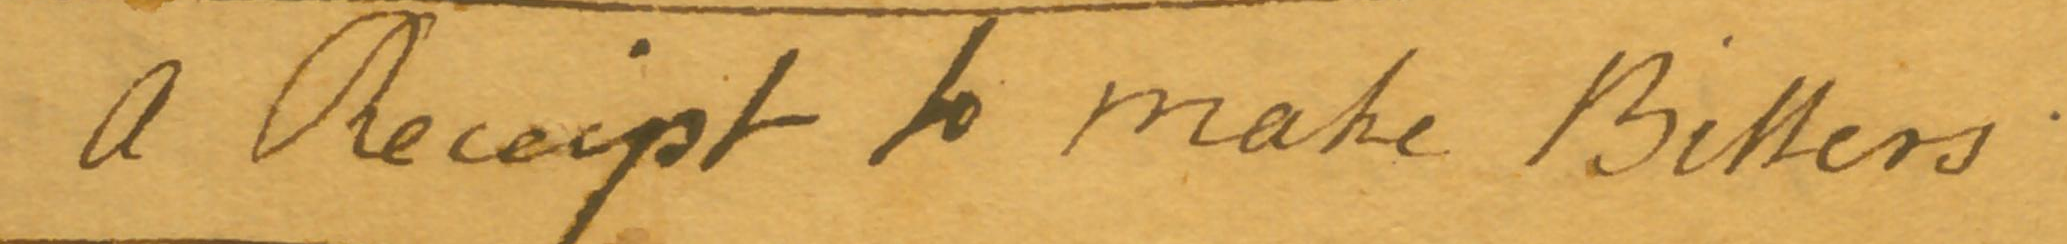A Receipt to make Bitters
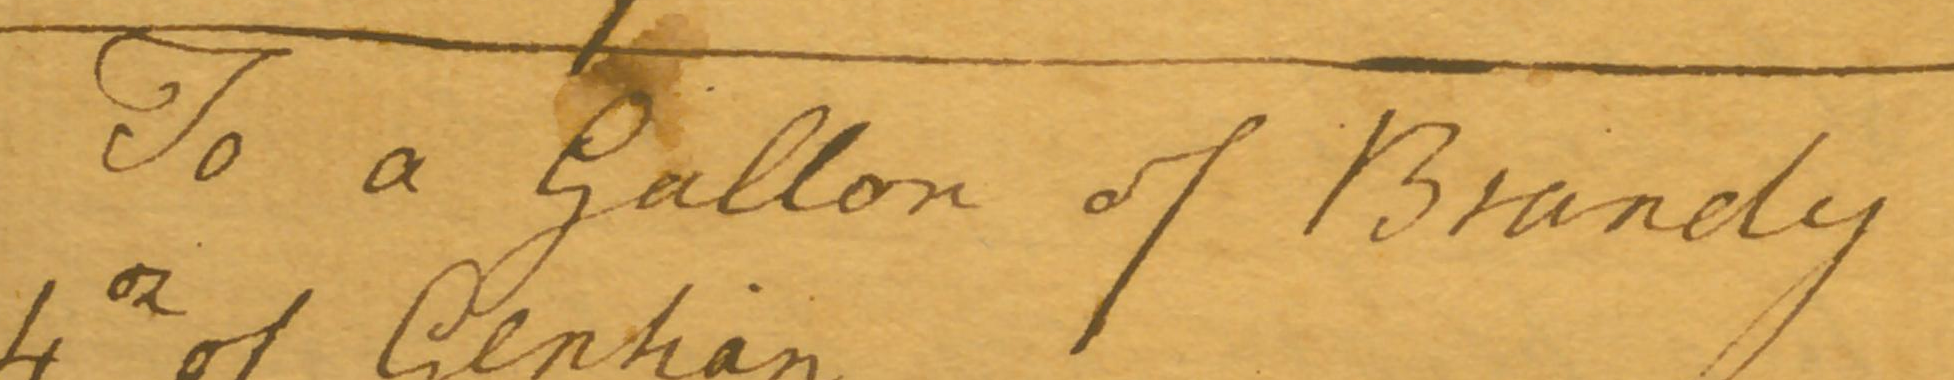To a Gallon of Brandy
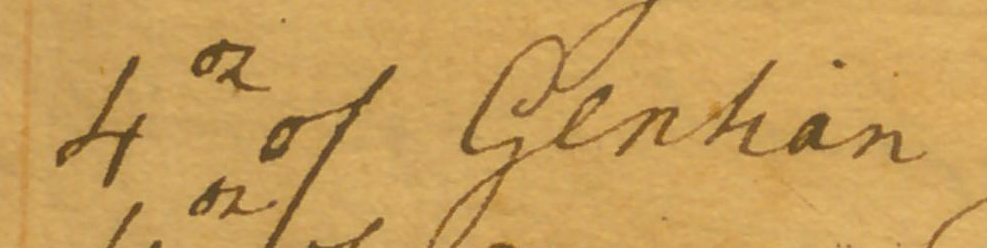4 ^oz of Gentian
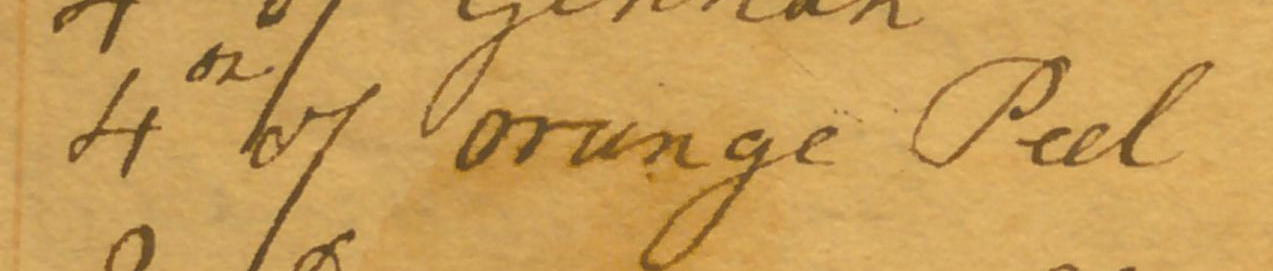4 ^oz of oringe Peel
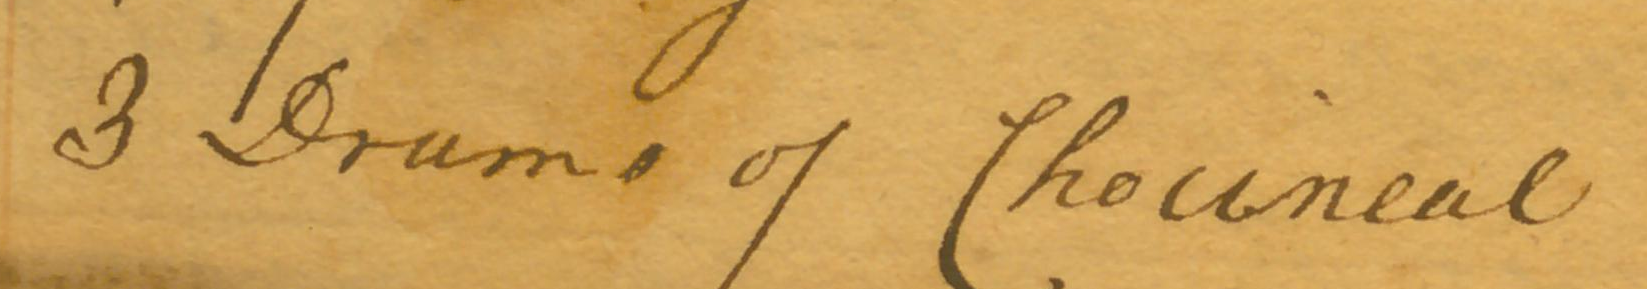3 Drums of Chocineal
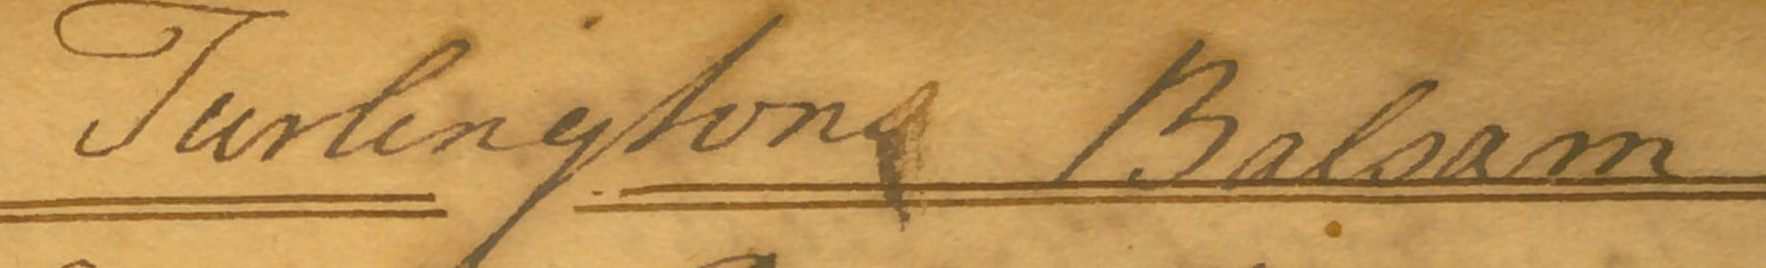Turlingtons Balsam
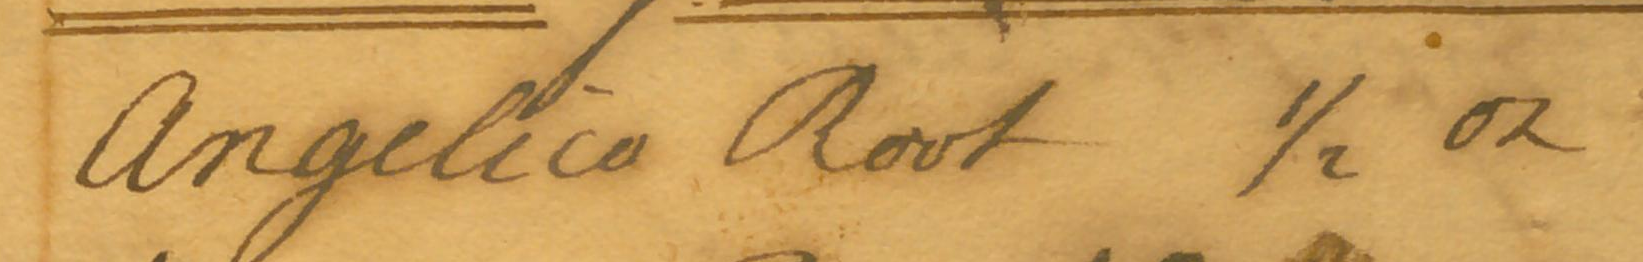Angelica Root 1/2 oz
